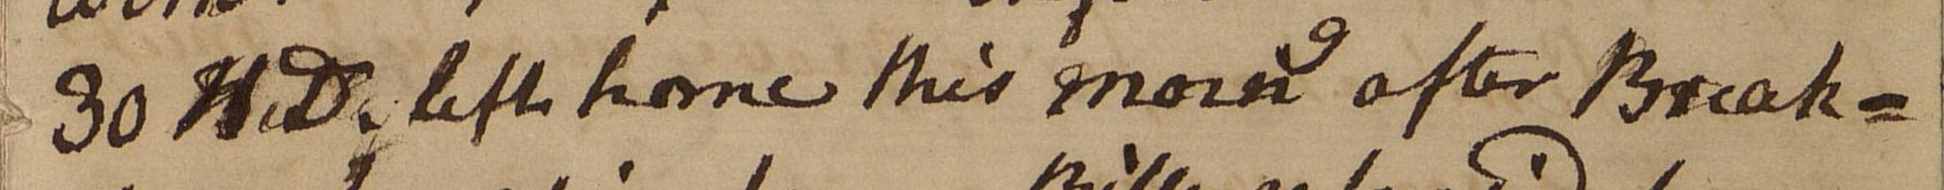30 H.D. left home this morn^g after Break-
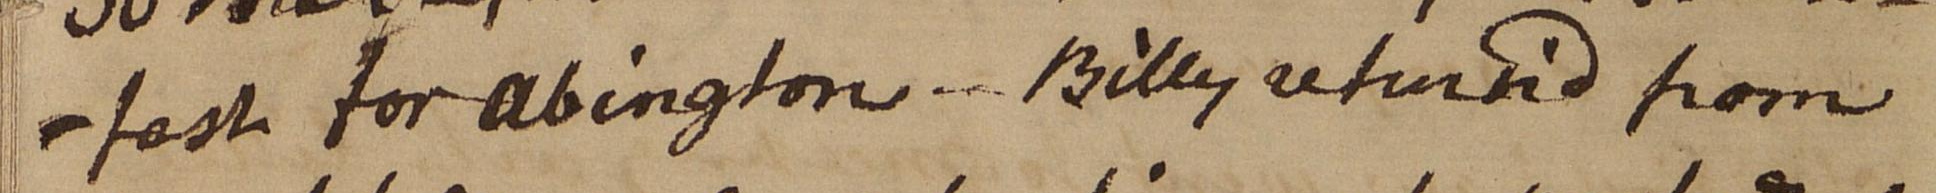-fast for Abington- Billy return'd from
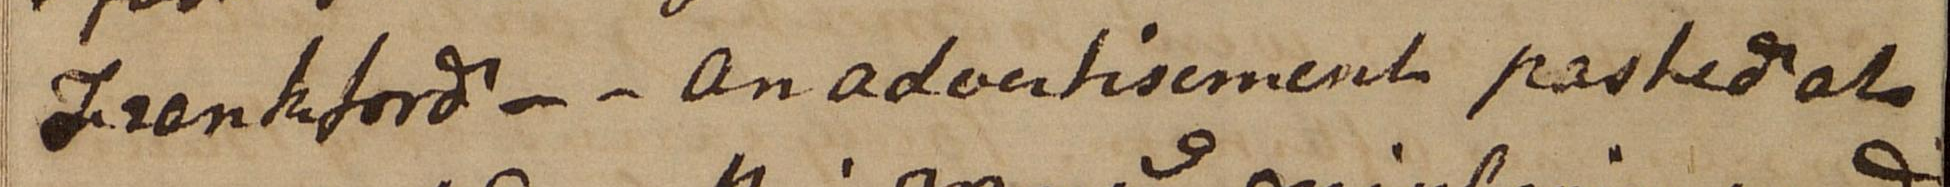Frankford-- An advertisement pasted at
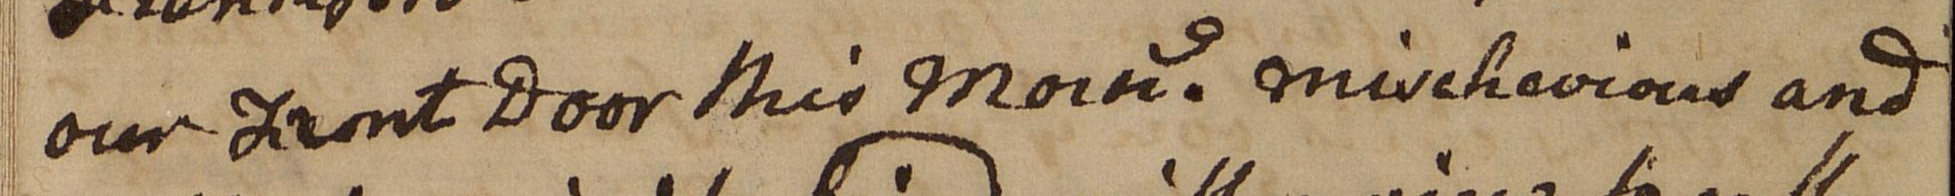our Front Door this morn^g. mischevious and
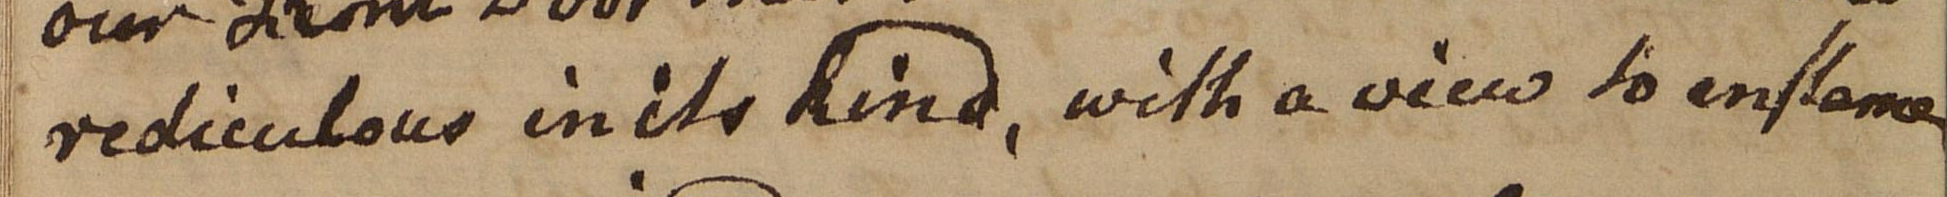rediculous in its kind, with a view to enflame
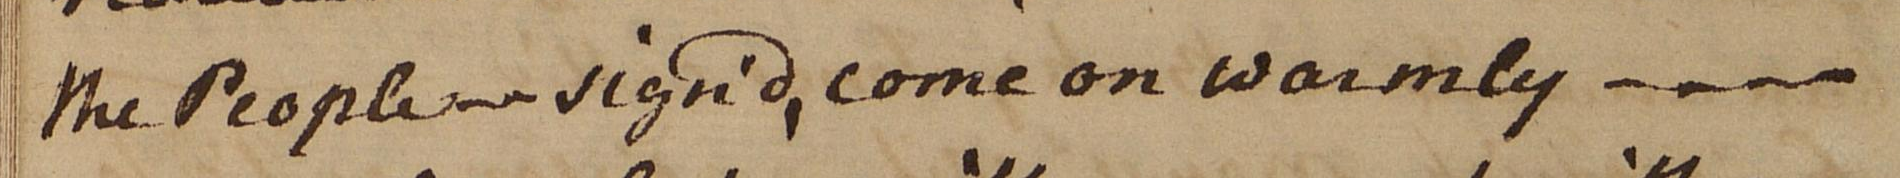the People- sign'd, come on warmly-
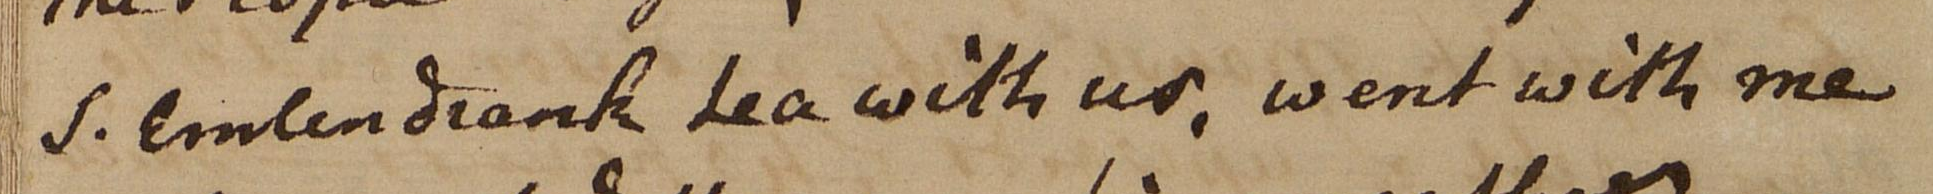S. Emlen drank tea with us, went with me
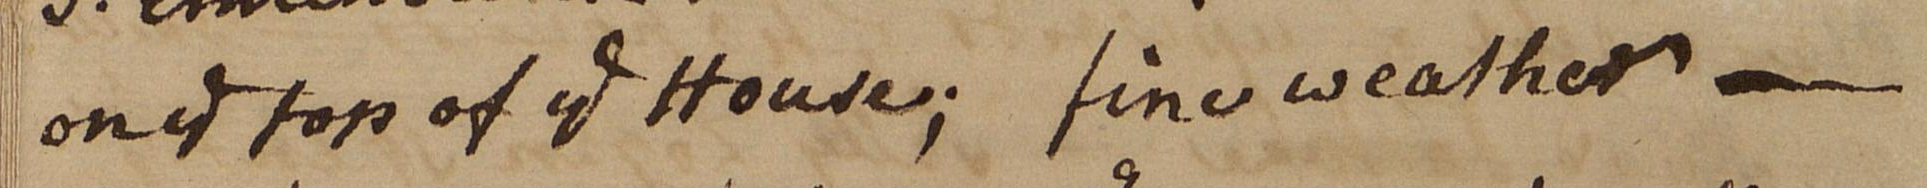on y^e top of y^e House; fine weather-
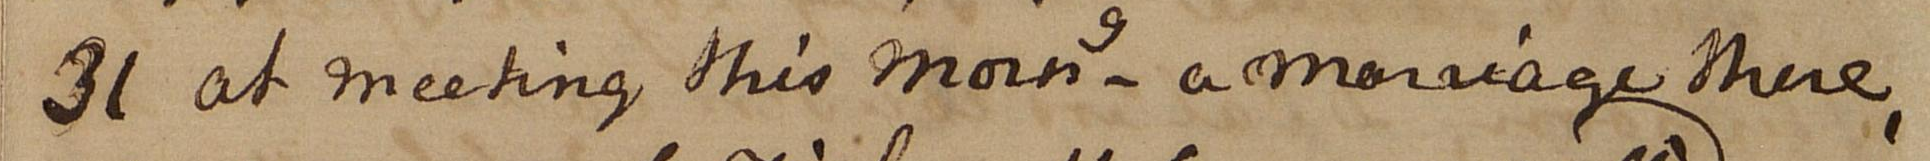31 at meeting this morn^g- a marriage there,
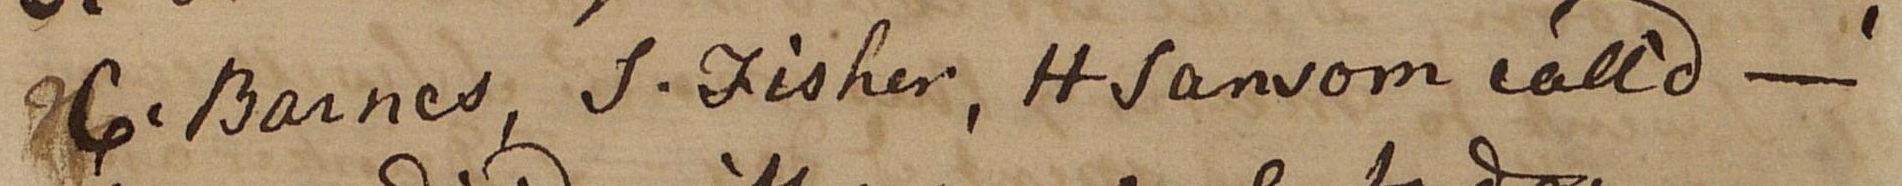C. Barnes, S. Fisher, H Sansom call'd-
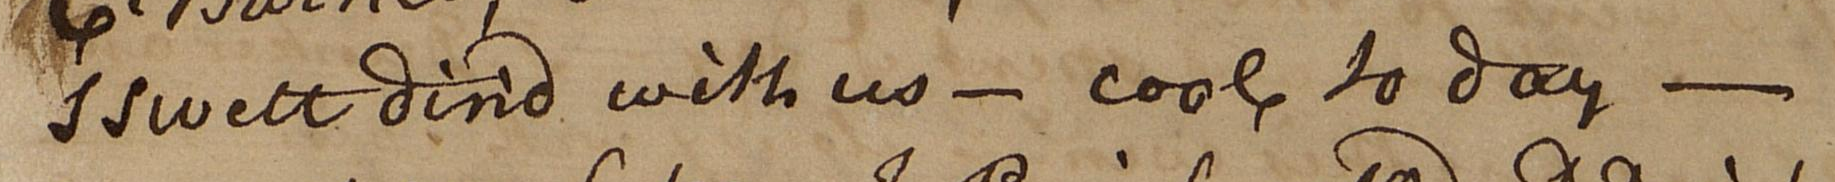S Swett din'd with us- cool to day-
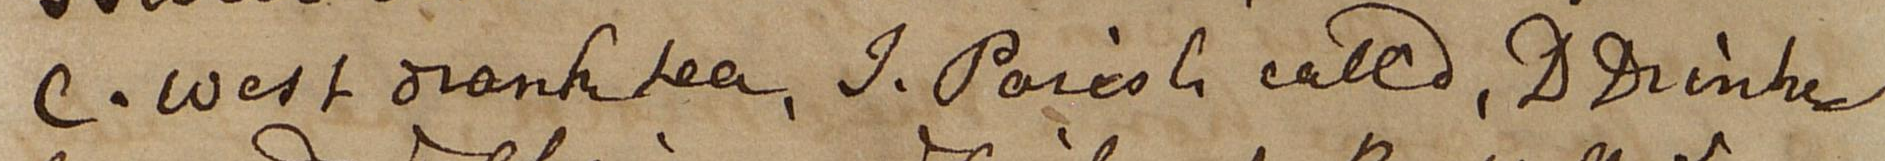C. West drank tea, I. Parish call'd, D Drinker
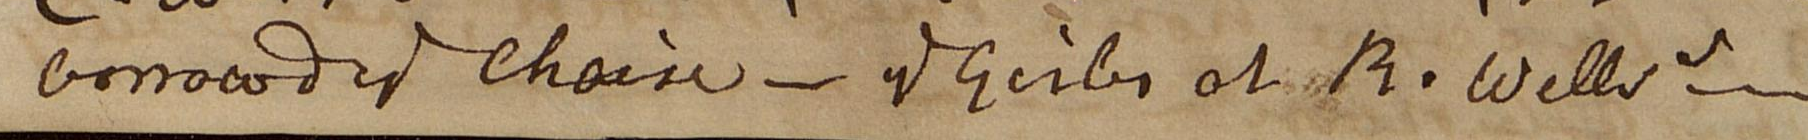borrow y^e Chaise - y^e Girles at R. Wells^s-
